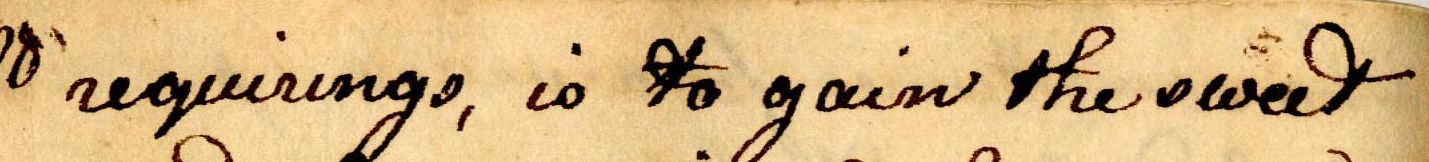requirings, is to gain the sweet
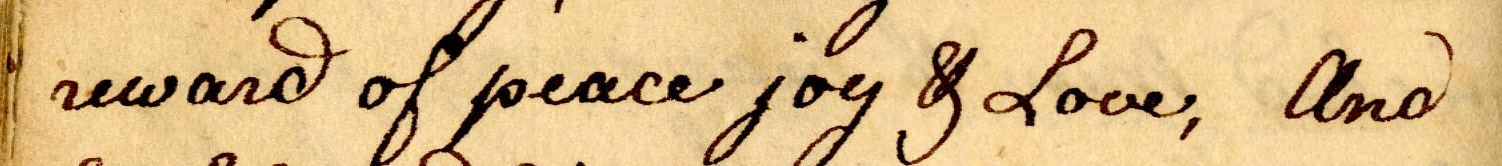reward of peace joy & Love, And
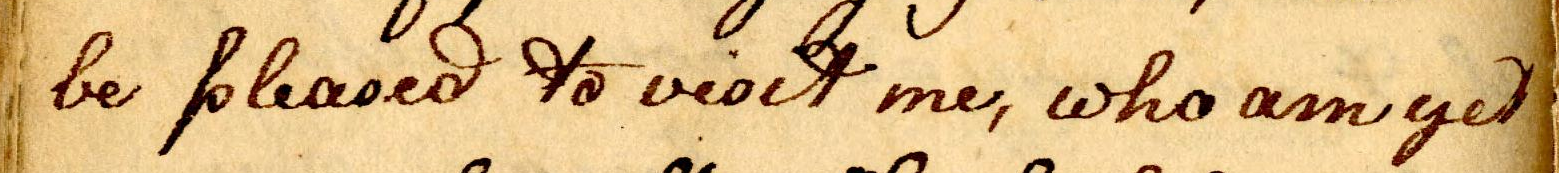be pleased to visit me, who am yet
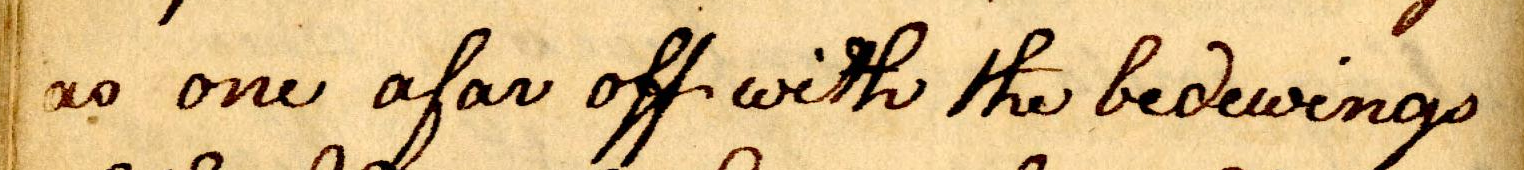as one afar off with the bedewings
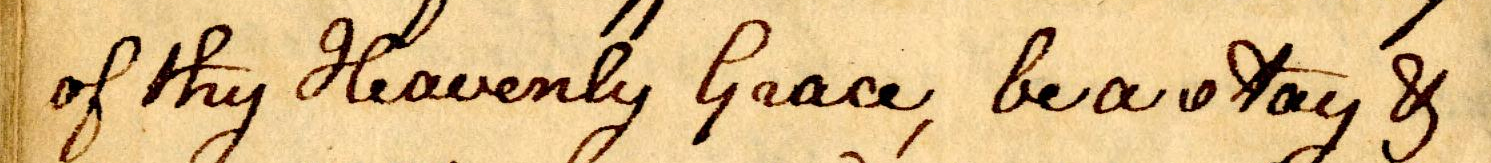of thy Heavenly Grace, be a stay &
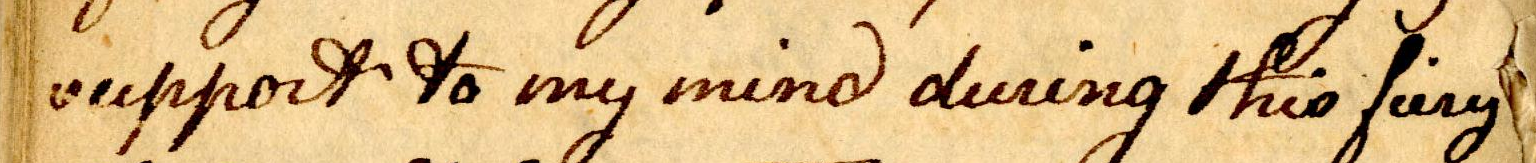support to my mind during this fury
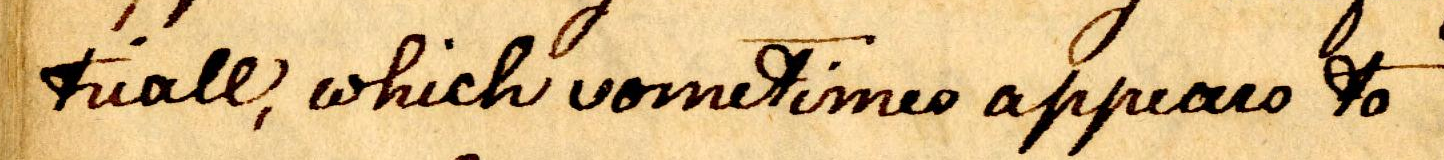triall, which sometimes appears to
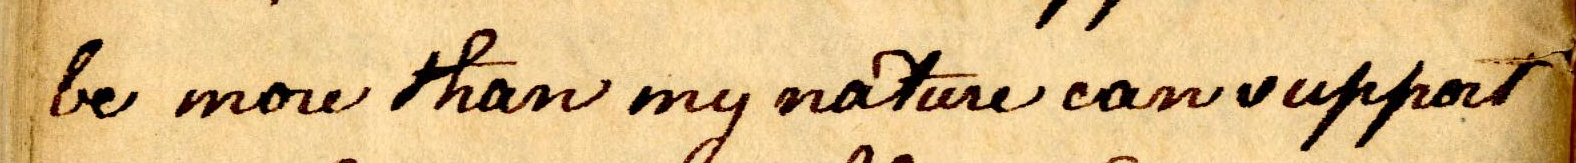be more than my nature can support
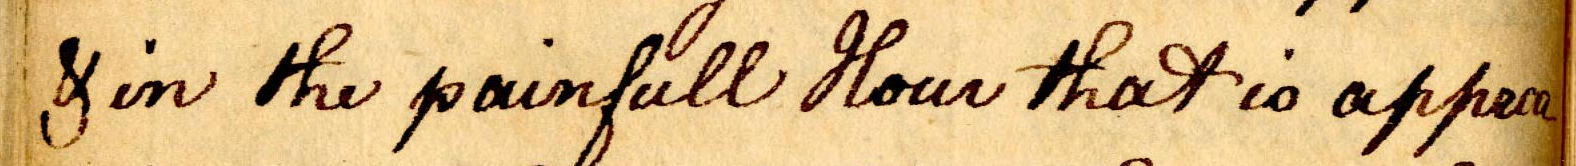& in the painfull Hour that is approa
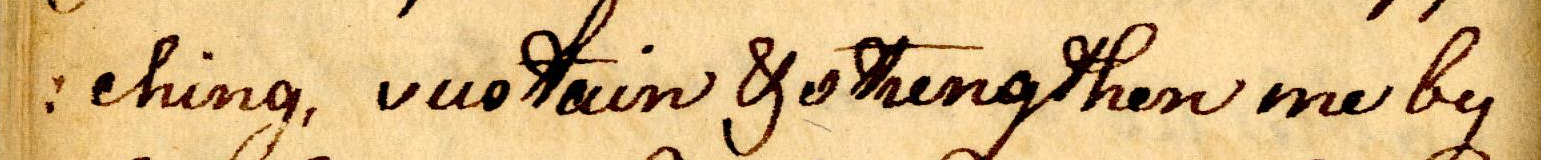-ching, sustain & strengthen me by
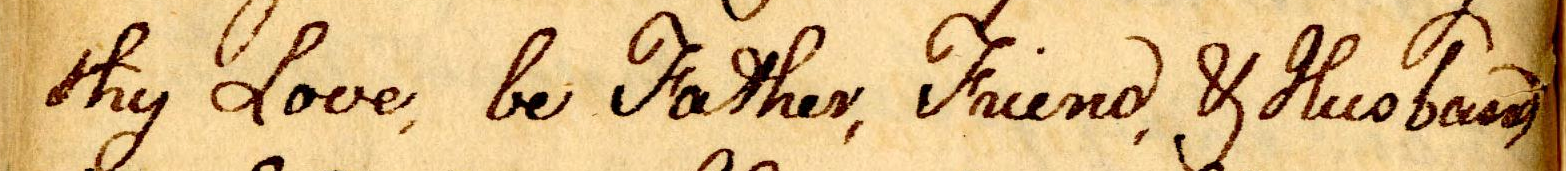thy Love, be Father, Friend, & Husband
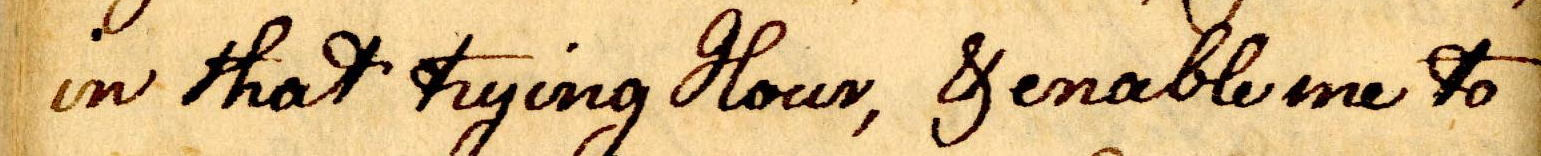in that trying Hour, & enable me to
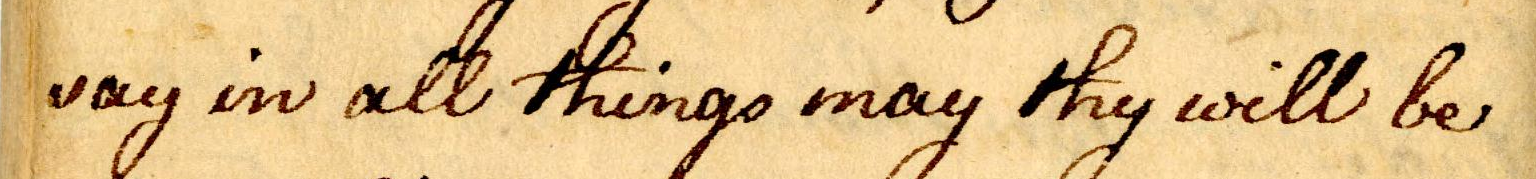say in all things may thy will be
